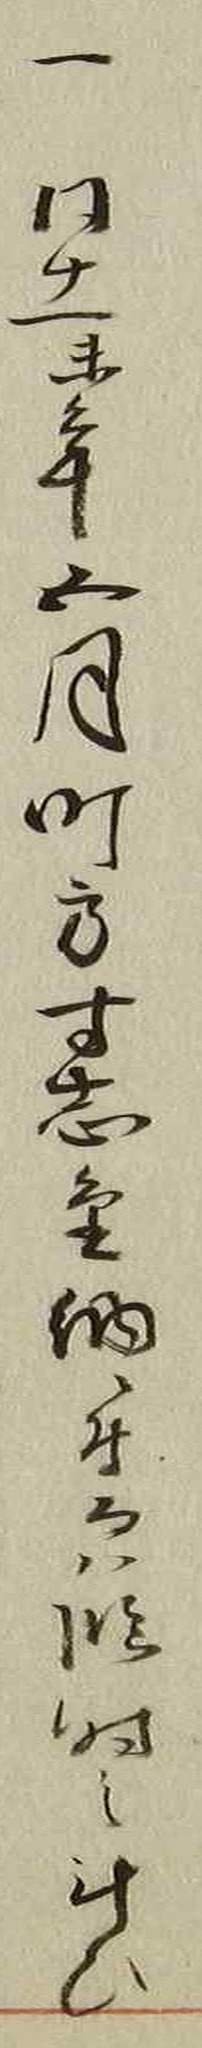一同十一未年五月町方寸志金納ニ付而は臨時之計ひ
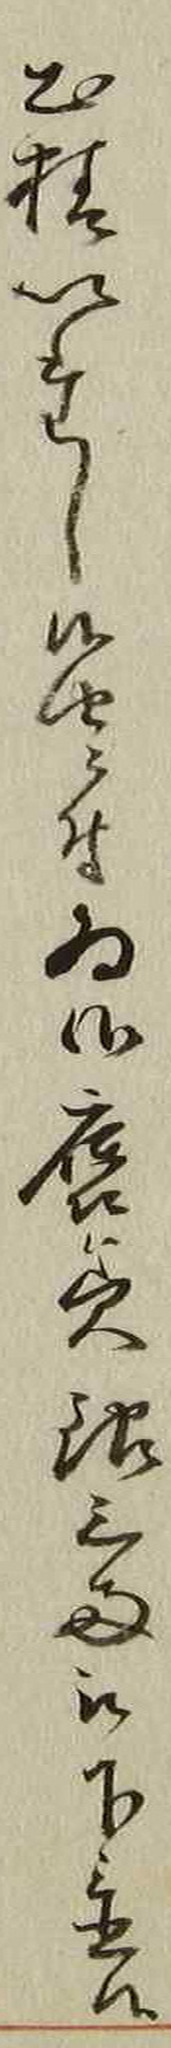出精いたし候由ニ付為御褒美銀三両被下置候
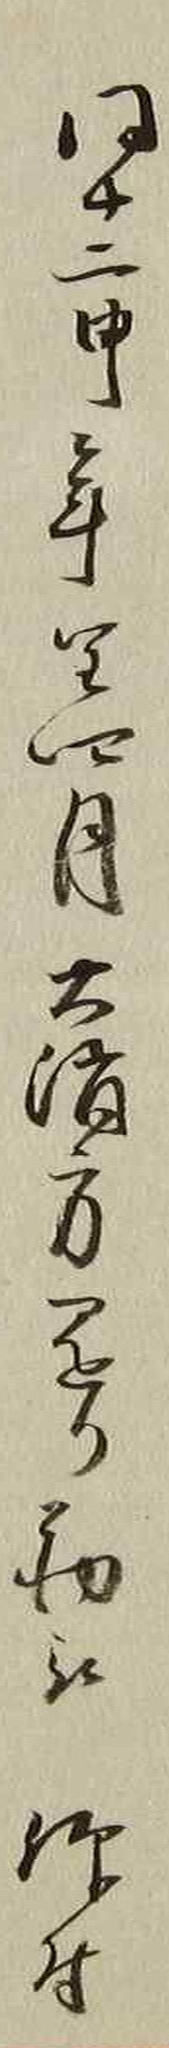一同十二申年閏四月火消方懸り勤被仰付
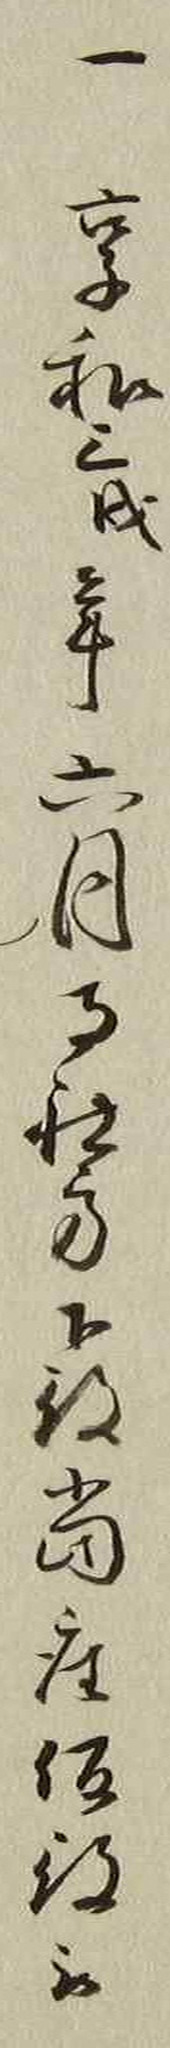一享和三戌年六月寺社方下役当座仮役被
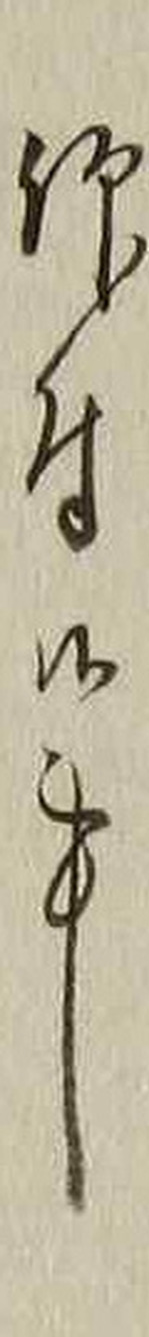仰付候事
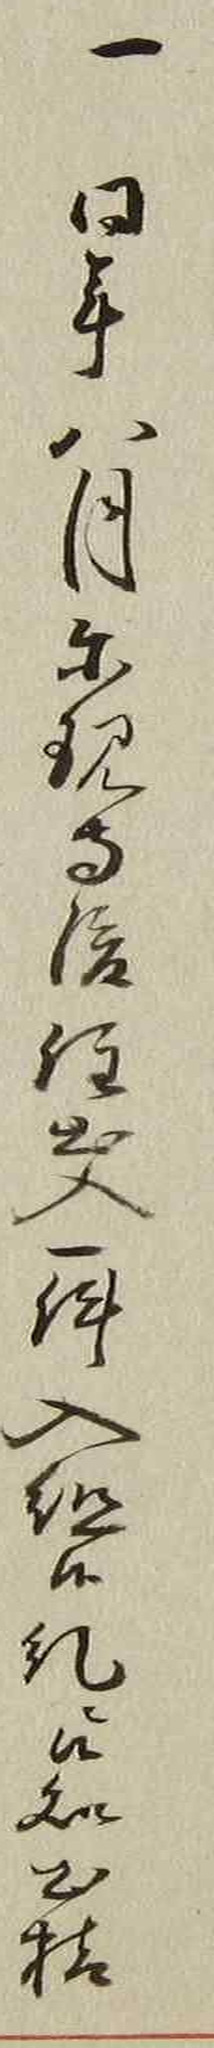一同年八月尓現寺後住出入一件入組候糺ニ候処出精
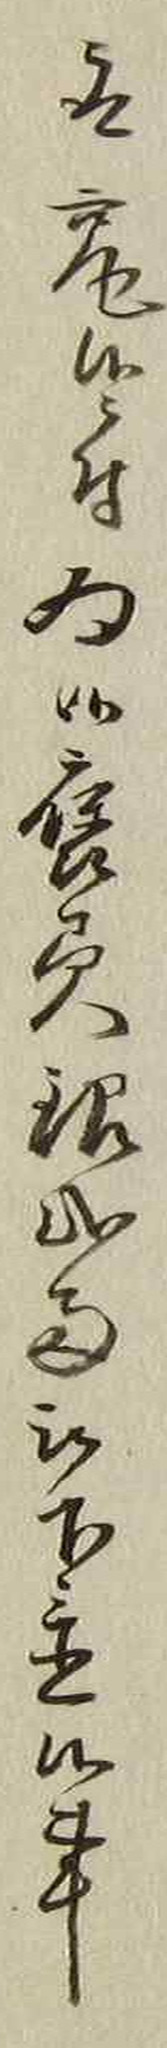取究候ニ付為御褒美銀弐両被下置侯事
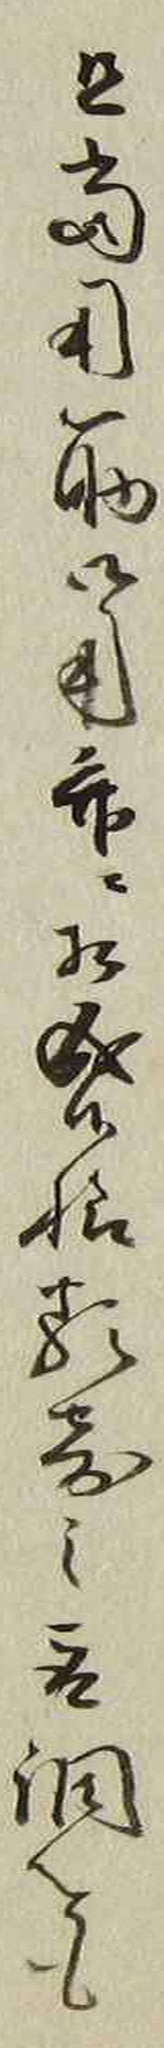且当用筋御用命ニ相成候様るす之取調をも
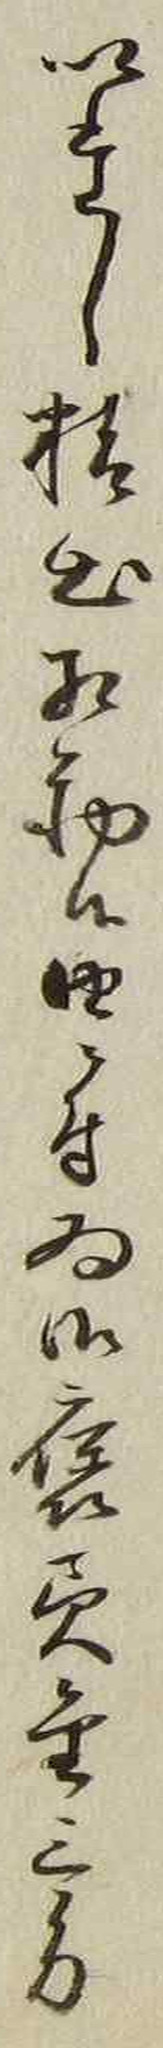いたし精出相勤候由ニ付為御褒美金三分
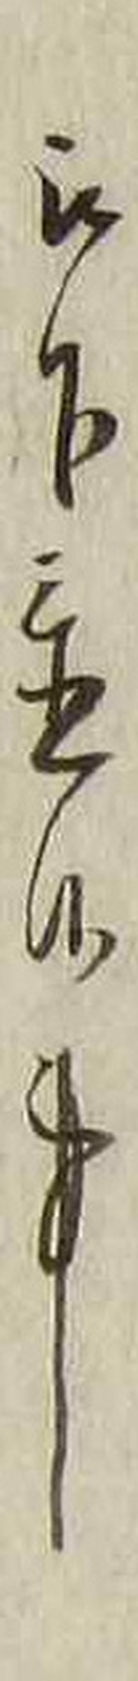被下置候事

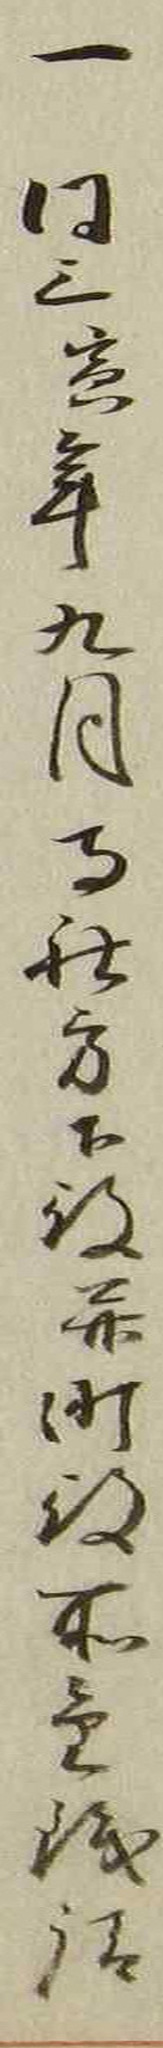一同三寅年九月寺社方下役幷町役所金銭請
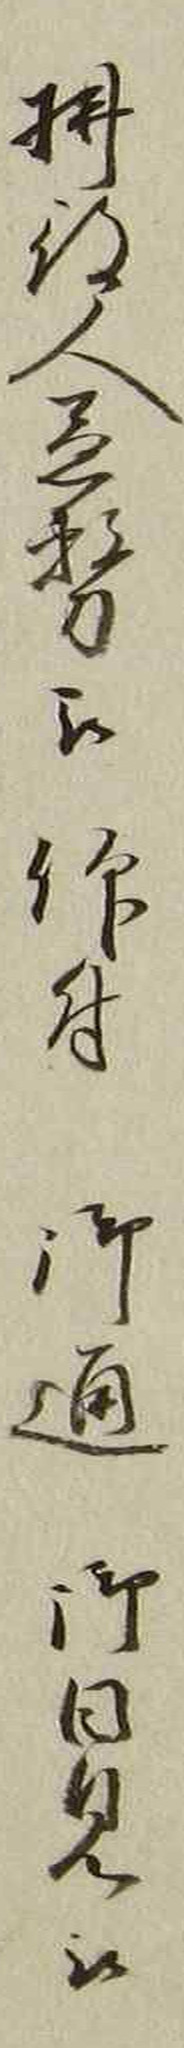払役人兼務被仰付御通御目見被
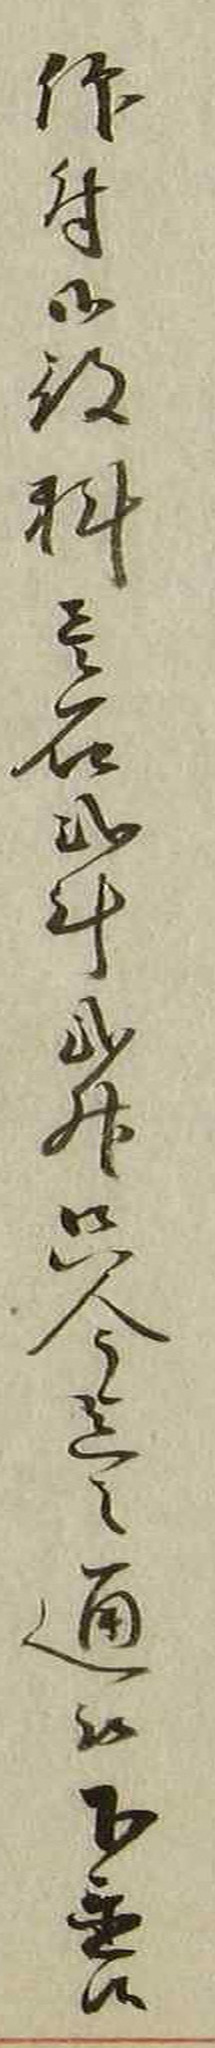仰付御役料壱石弐斗弐升只今迄之通被下置候
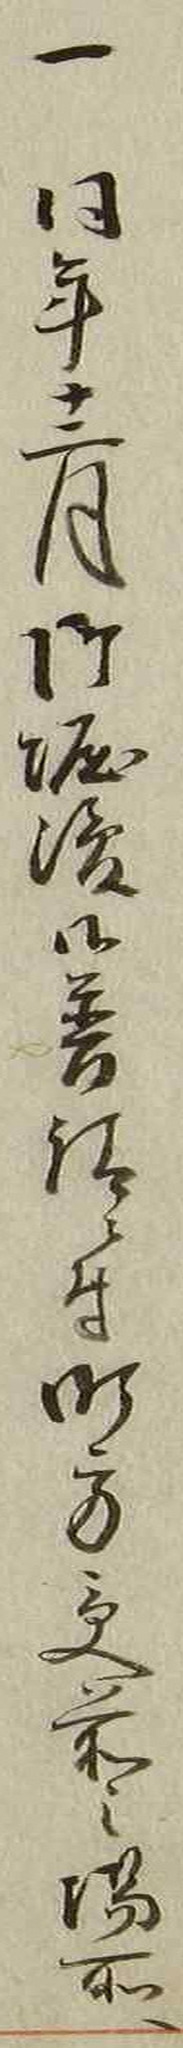一同年十二月御堀浚御普請ニ付町方受前之場所へ
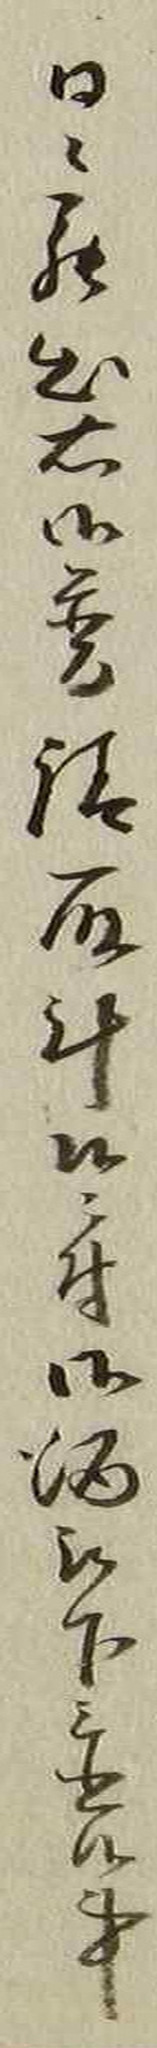日々罷出右御普請取計候ニ付御酒被下置候事
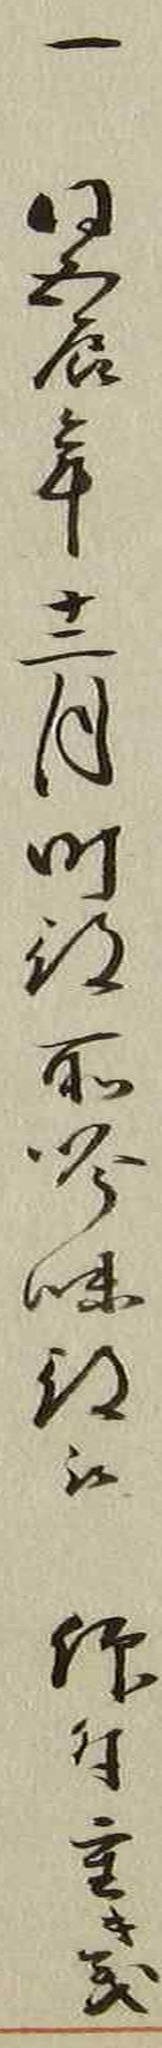一同五辰年十二月町役所吟味役被仰付重き義
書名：諸士系譜　巻之32　い之部32
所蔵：会津若松市立会津図書館
